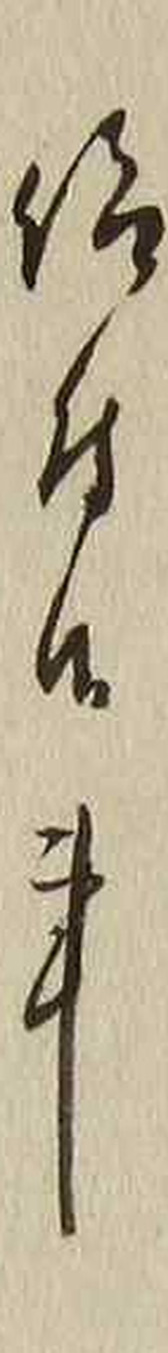仰付候事
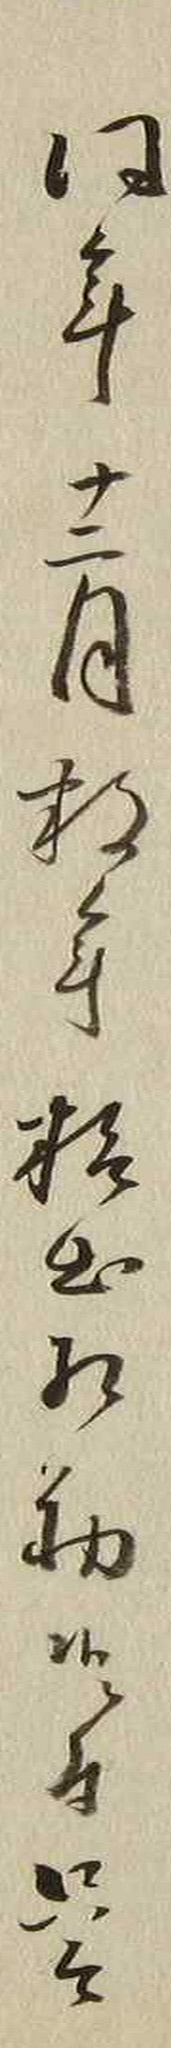一同年十二月数年精出相勤候ニ付只今
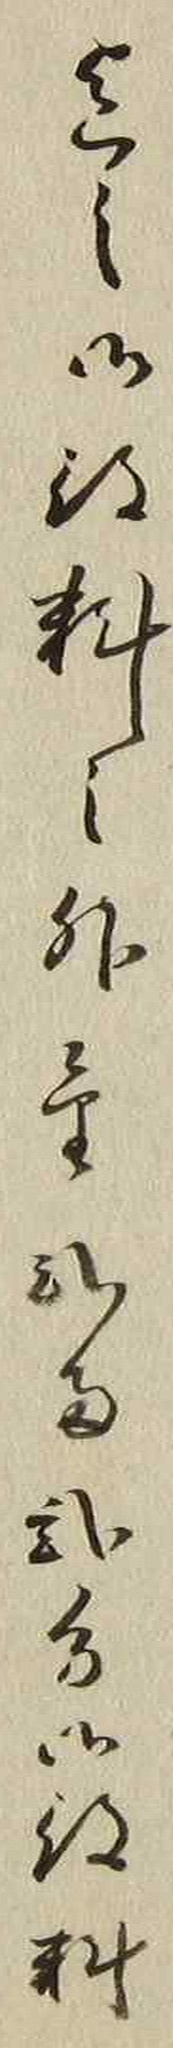迄之御役料之外金弐両弐分御役料
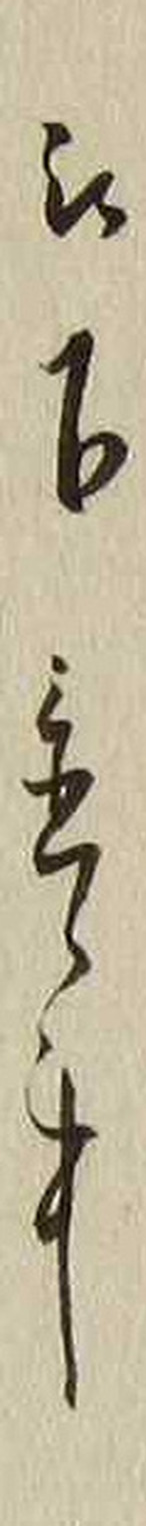被下置候事
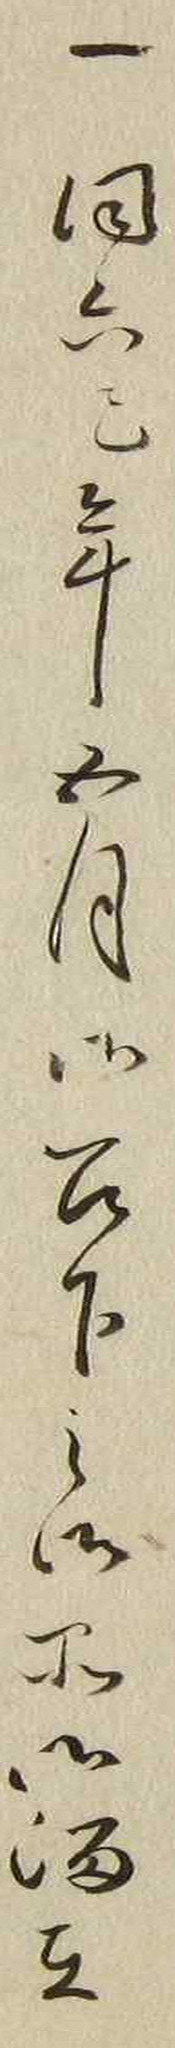一同六巳年五月御召下之御品御溜在
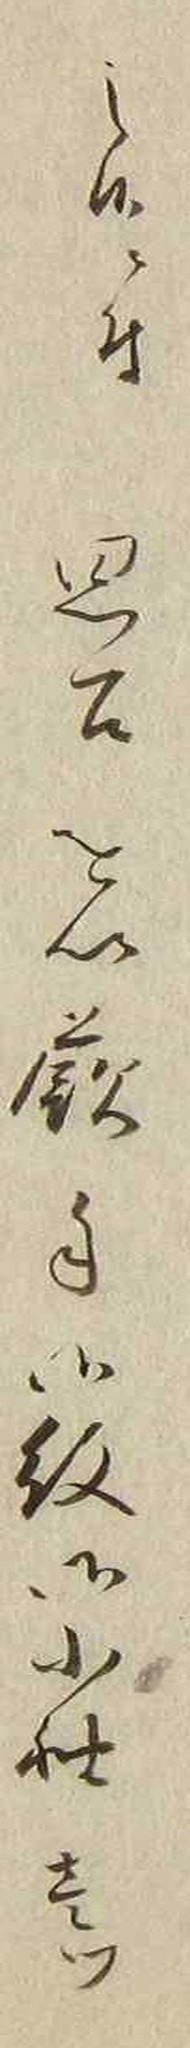之候ニ付思召を以蕨手御紋御小袖壱ツ
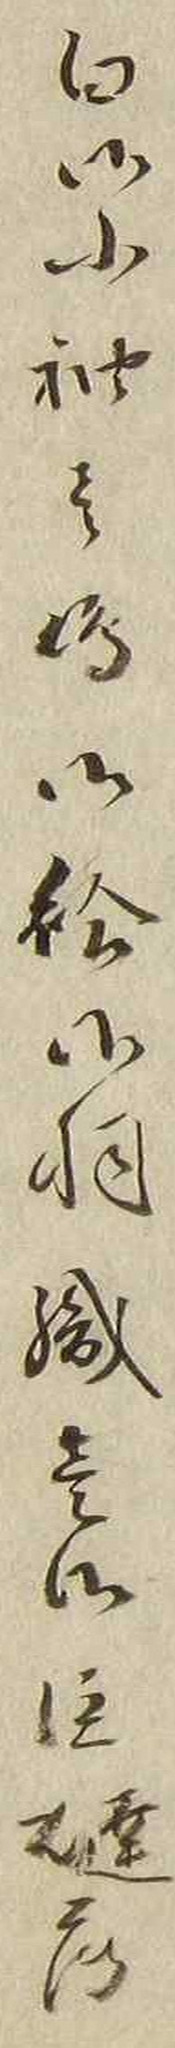白御小袖壱嶋御袷御羽織壱御炬燵蒲

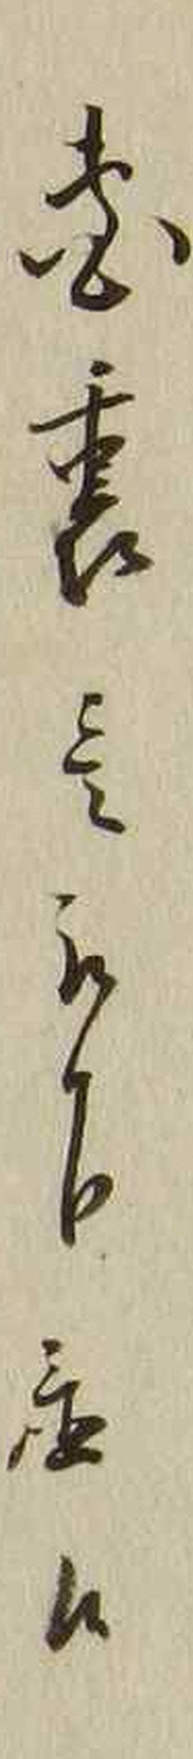団裏壱被下置候
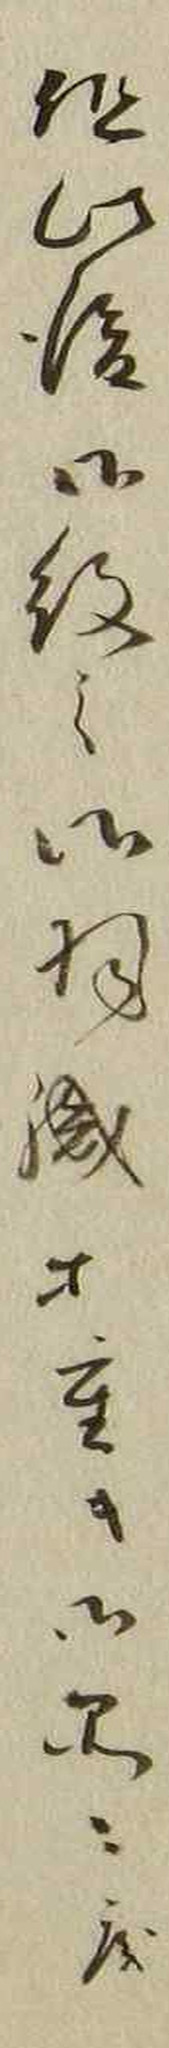但此後御紋之御羽織等重キ御品々も
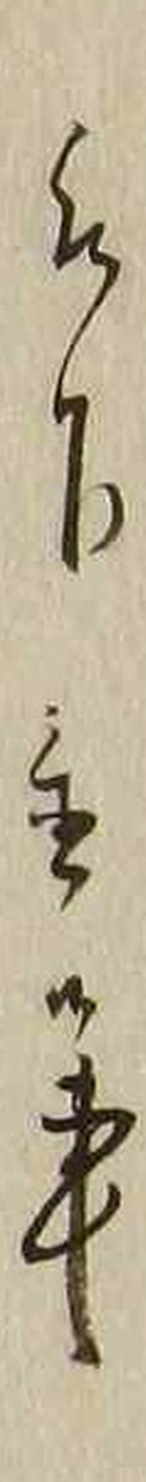被下置候事
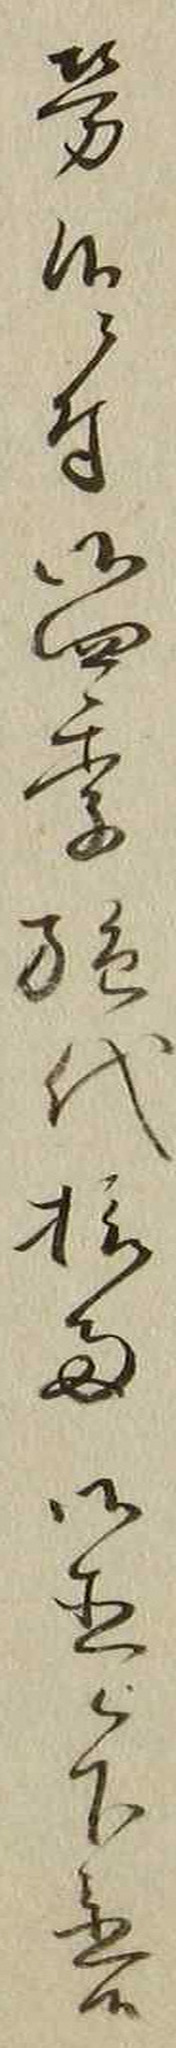労候ニ付御四季施代拾両御直被下書置候
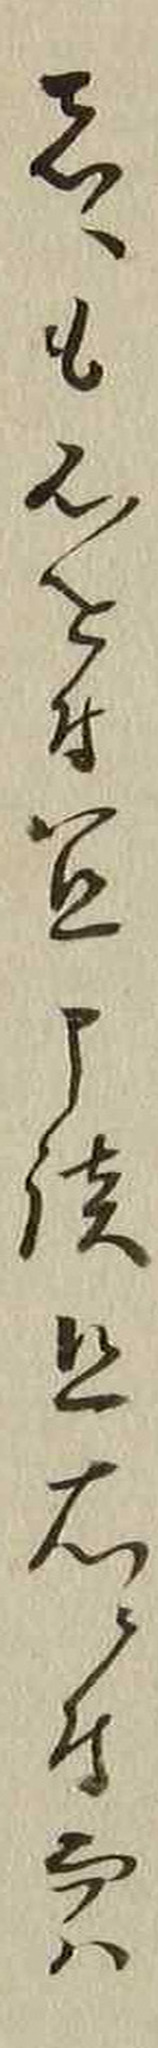者へも心を付宜申談旦右ニ付而ハ
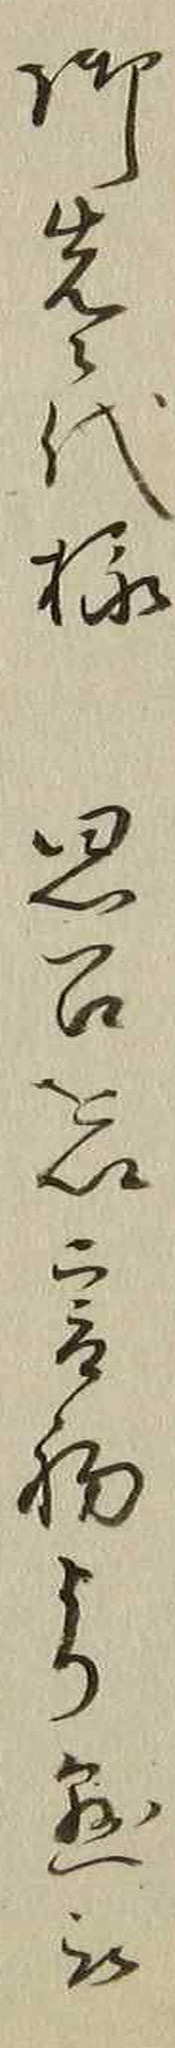御先々代様思召を以最初より懸被
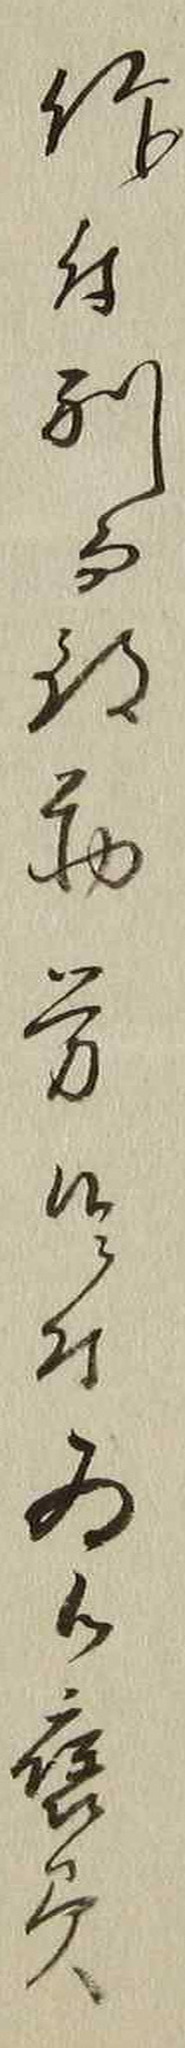仰付別而致勤労候ニ付為御褒美
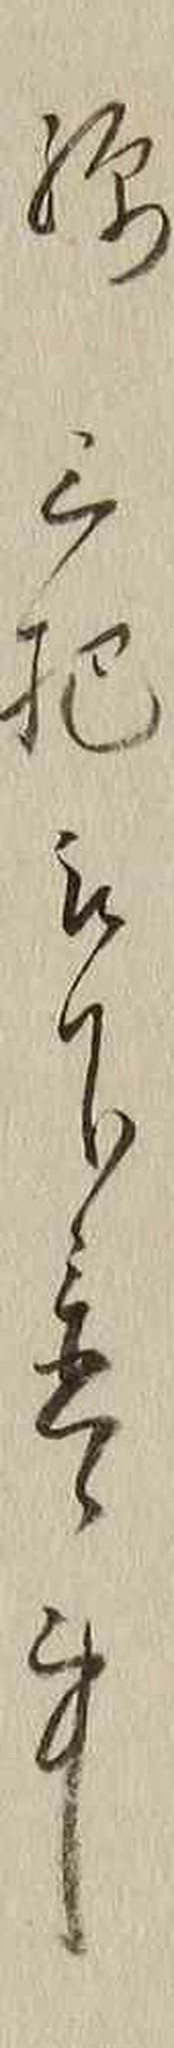綿三把被下置候事
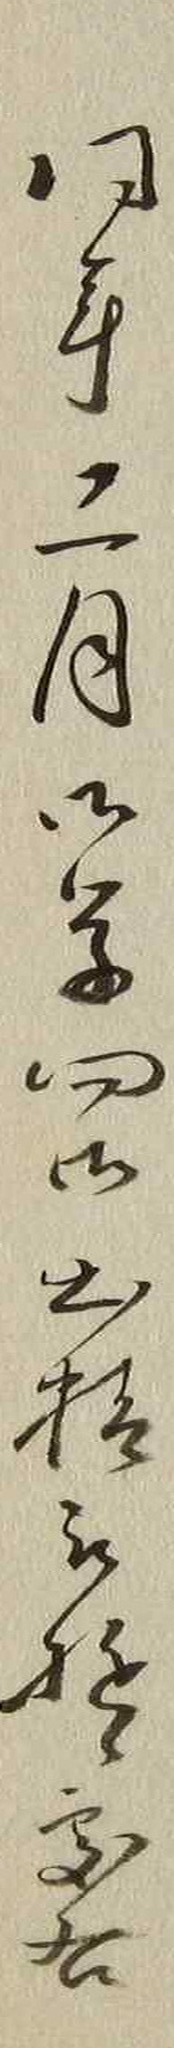一同年十一月御学問御出精被遊候処右
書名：諸士系譜　巻之25　い之部25
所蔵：会津若松市立会津図書館
